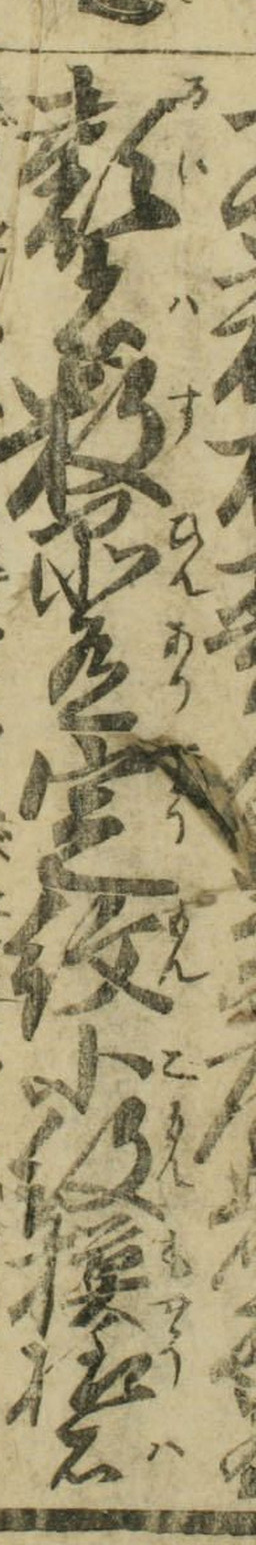類者数品有定紋小紋摸様者
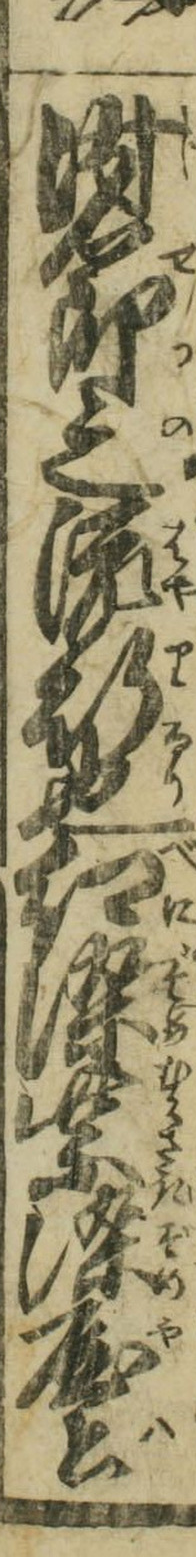時節之流行也紅染紫染屋者
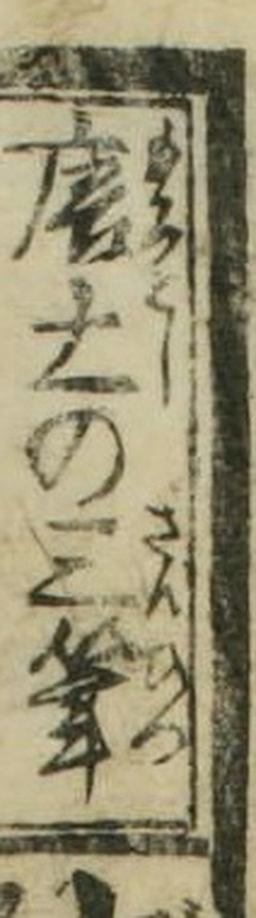唐土の三筆
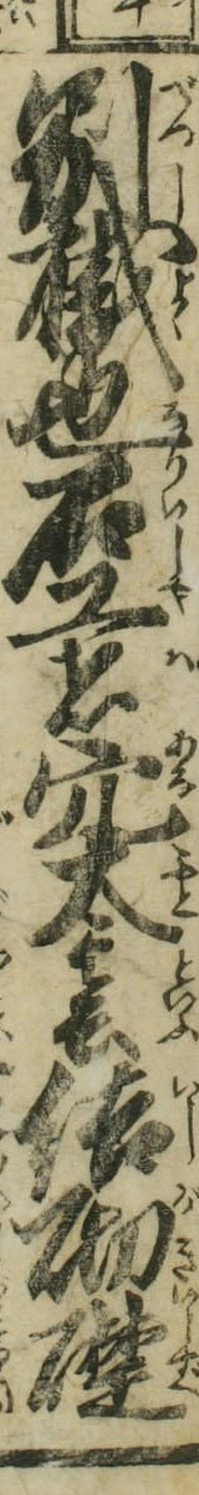別職也石工者穴太与云結砌礎
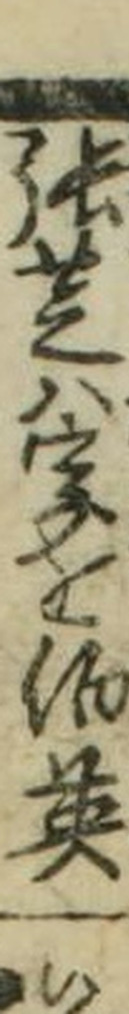張芝は字を伯英
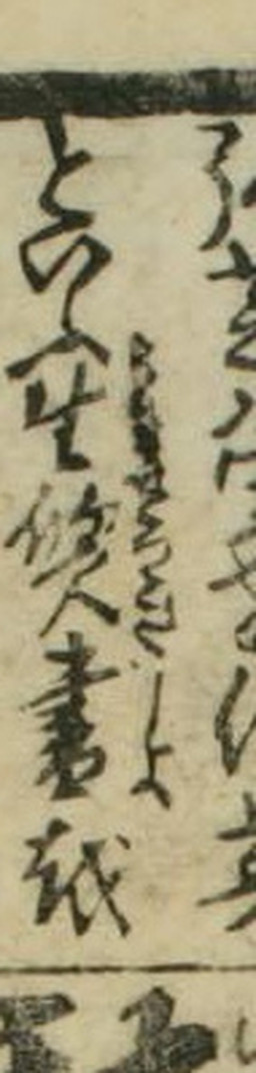といふ生質書を
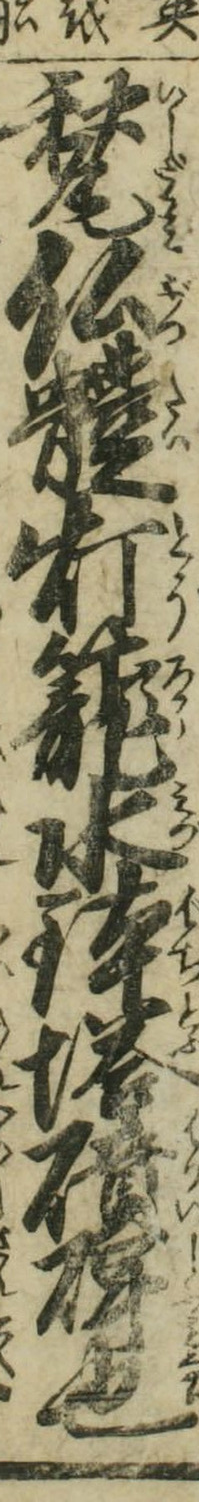甃仏體灯籠水鉢塔墳碑也
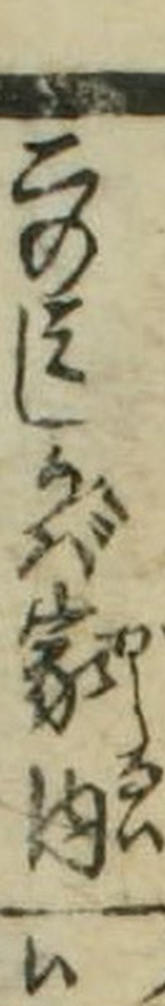このみしかば家内
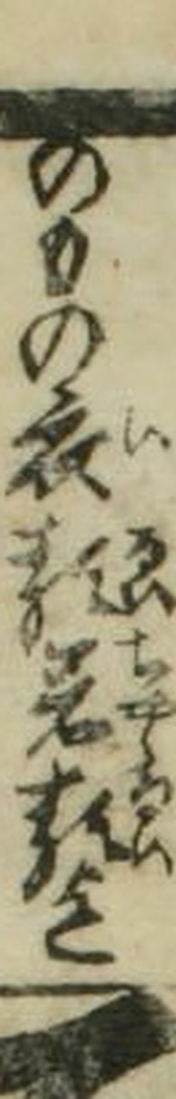のもの衣類着類迄
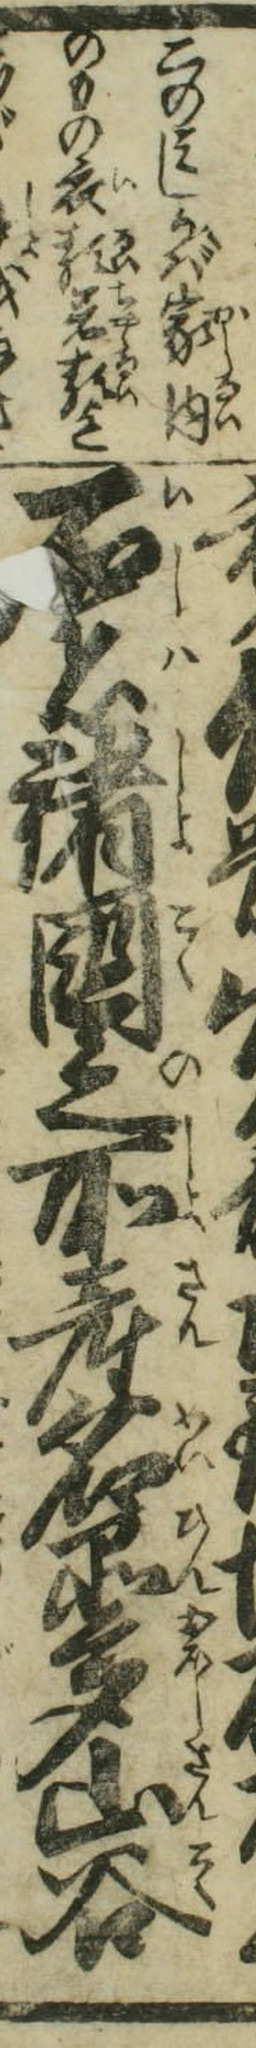石者諸國之所産名品多山谷
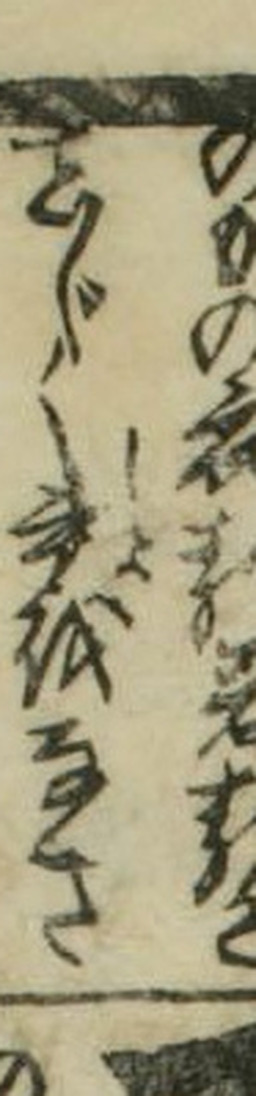こと〴〵く書をなさ
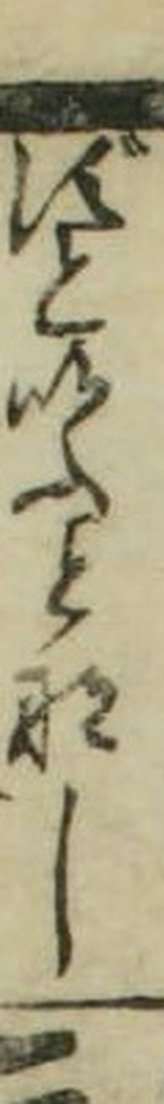ずといふことなし
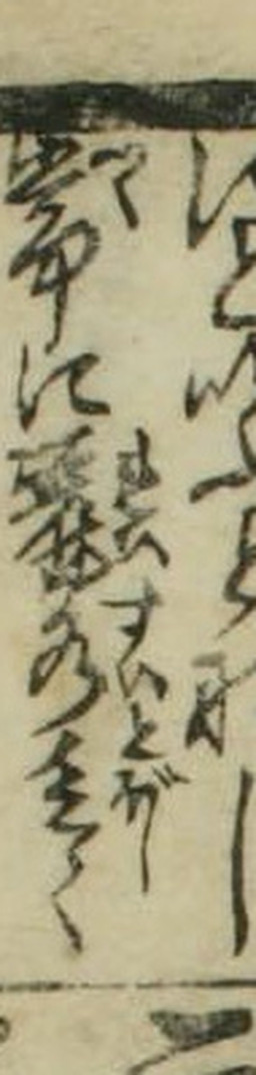常に麗水乏く
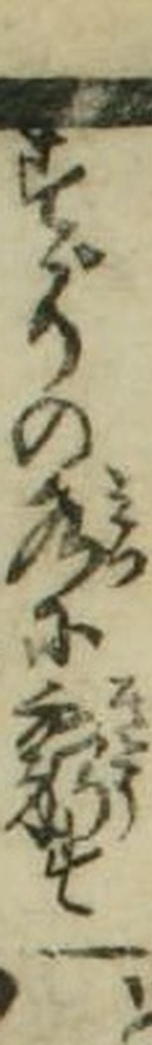すゞりの水に窮す
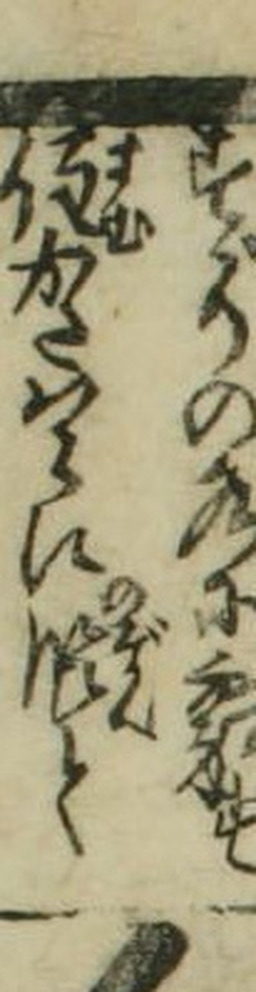住かたはらに臨と
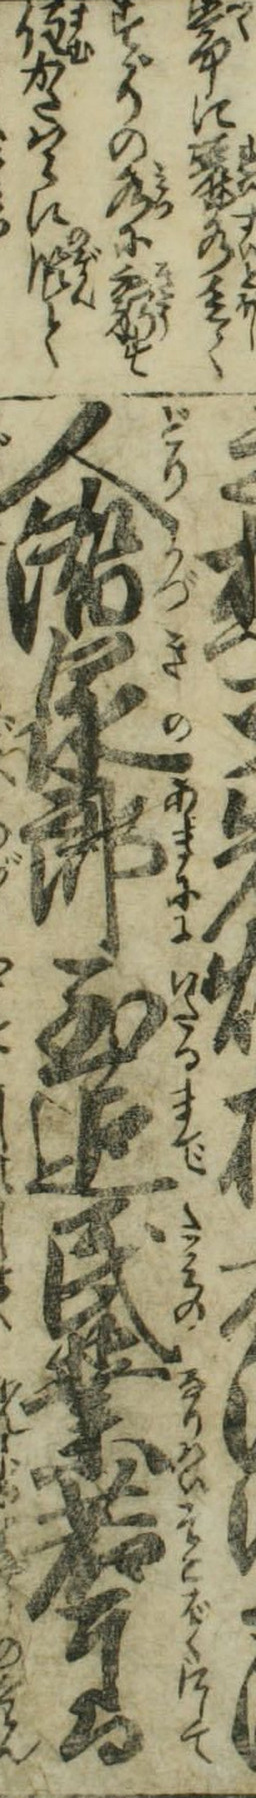人潜家郎至迄民業若干而
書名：増補職人往来
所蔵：東京学芸大学教育コンテンツアーカイブ
